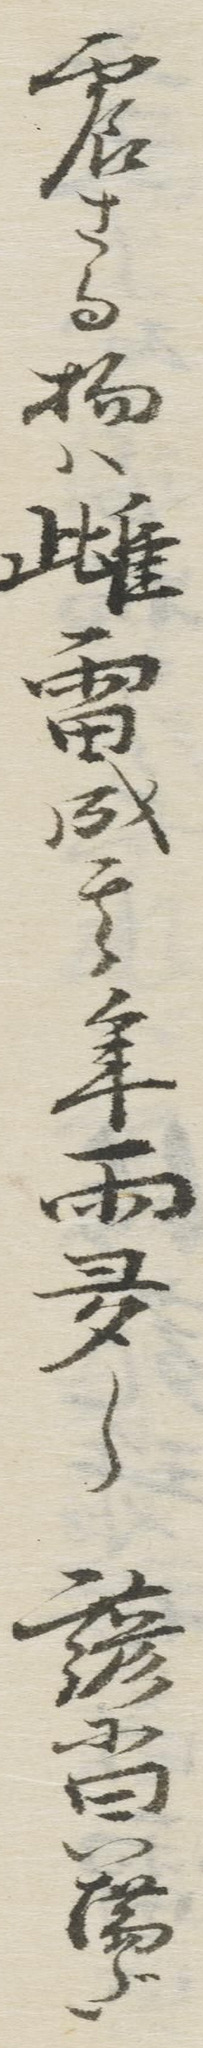震さる物ハ雌雷成其年雨多し諺に曰いまだ
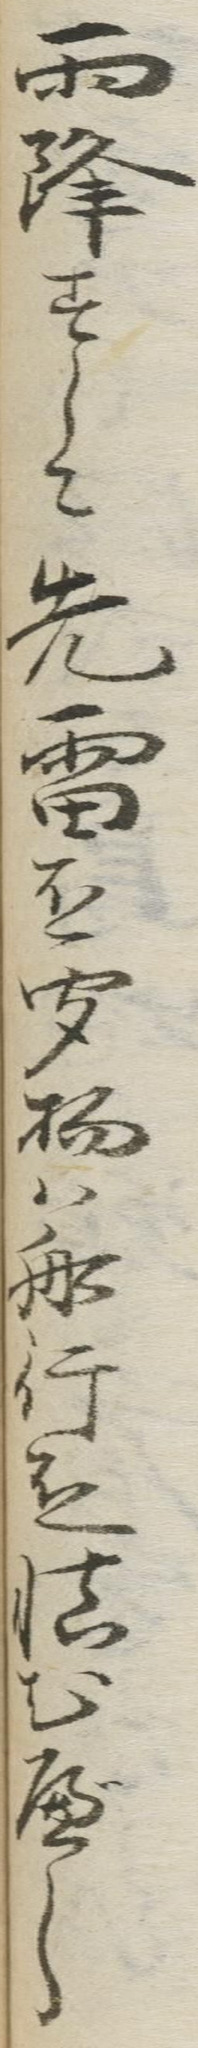雨降ずして先雷を聞物ハ船行を慎むべし
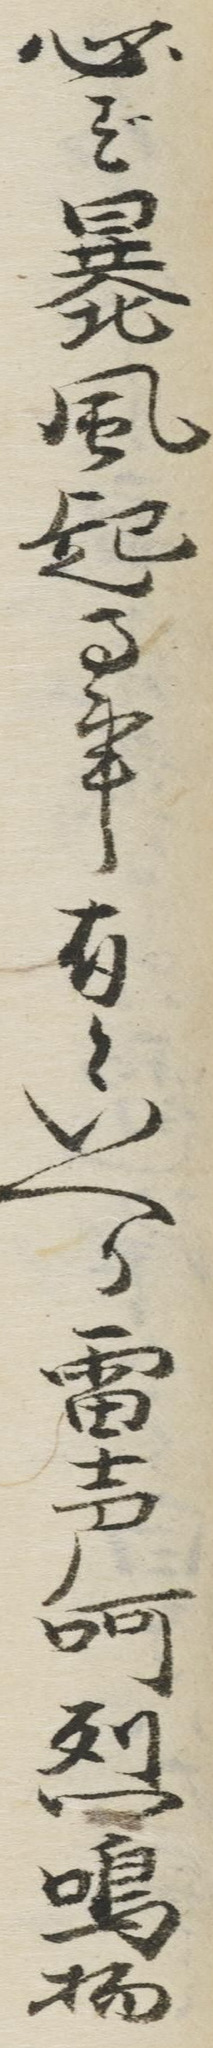必ず暴風起る事有といへり雷声呵烈鳴物
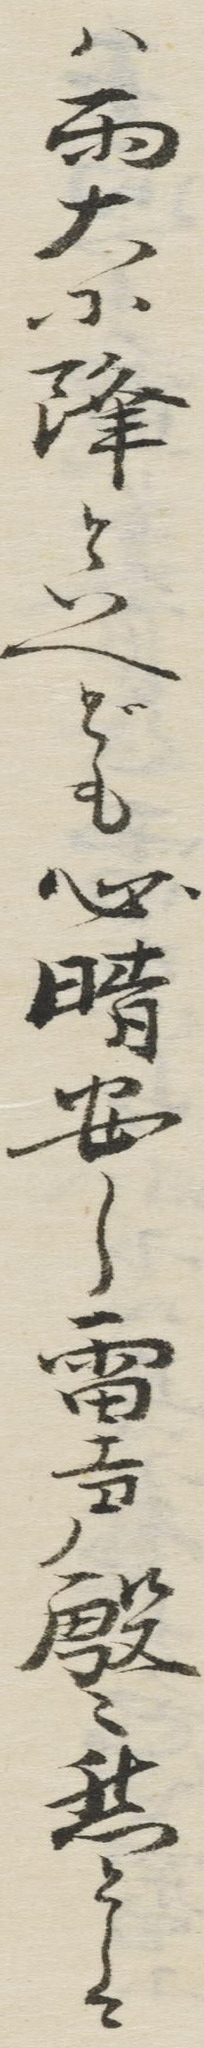ハ雨大に降るといへども必晴安し雷声殷々然として
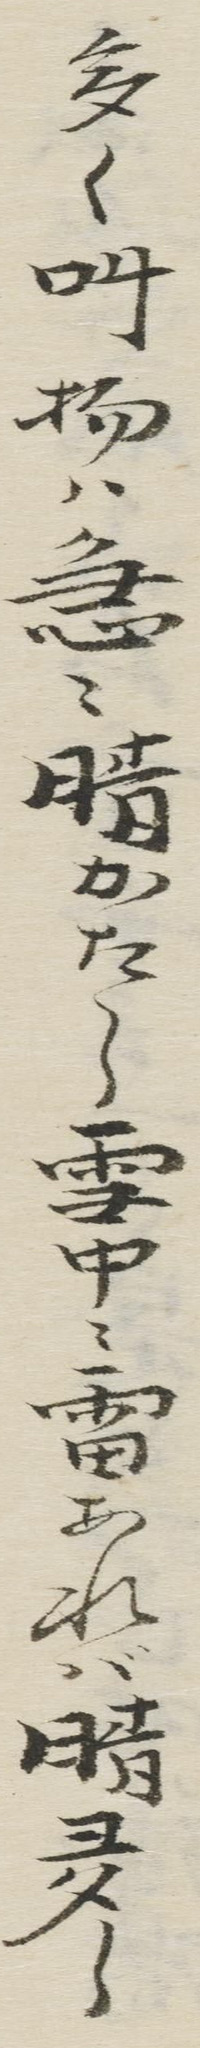多く叫ぶ物ハ急ニ晴かたし雪中ニ雷あれバ晴多し
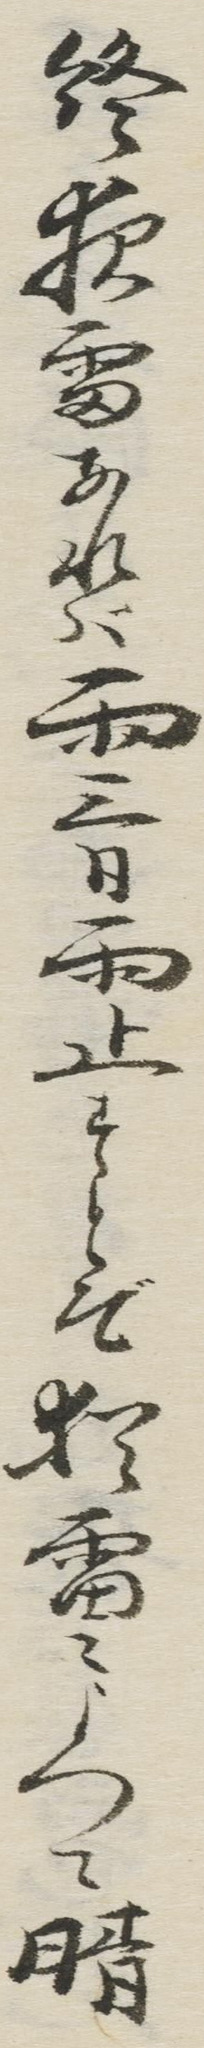終夜雷あれバ雨三日雨止すとぞ猶雷ニよつて晴
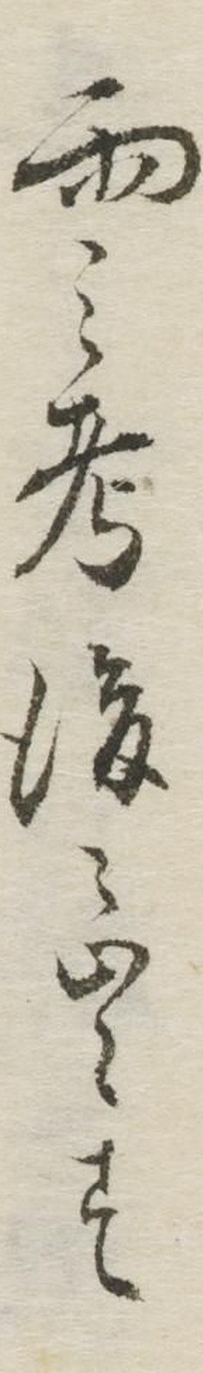雨之考え後二出ス
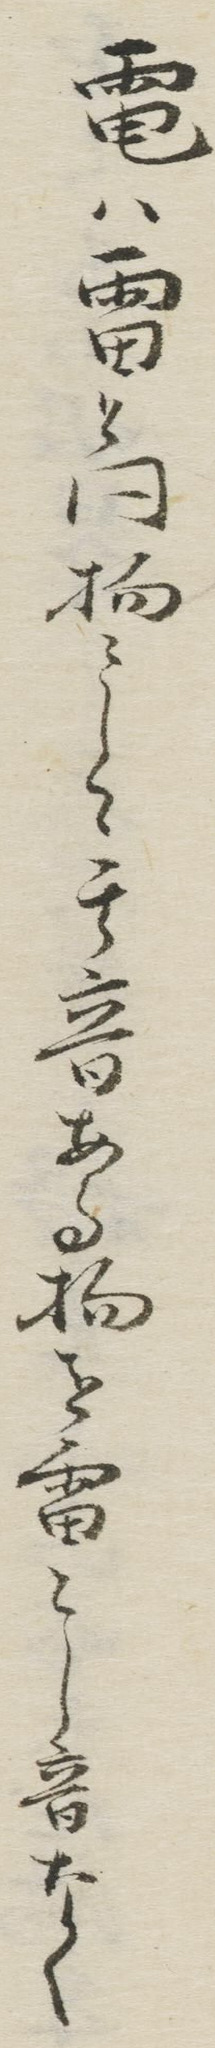電ハ雷と同物として其音ある物を雷とし音なく
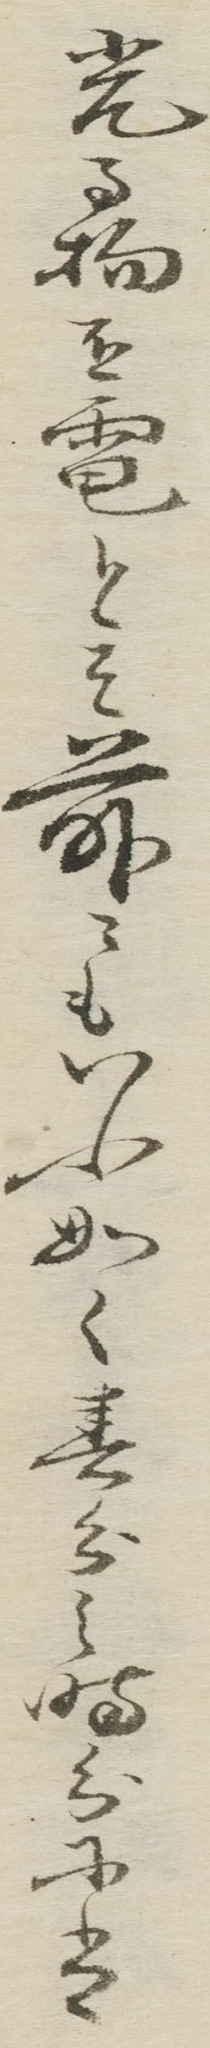光る物を電とミ前ニもいふ如く春分之時分には

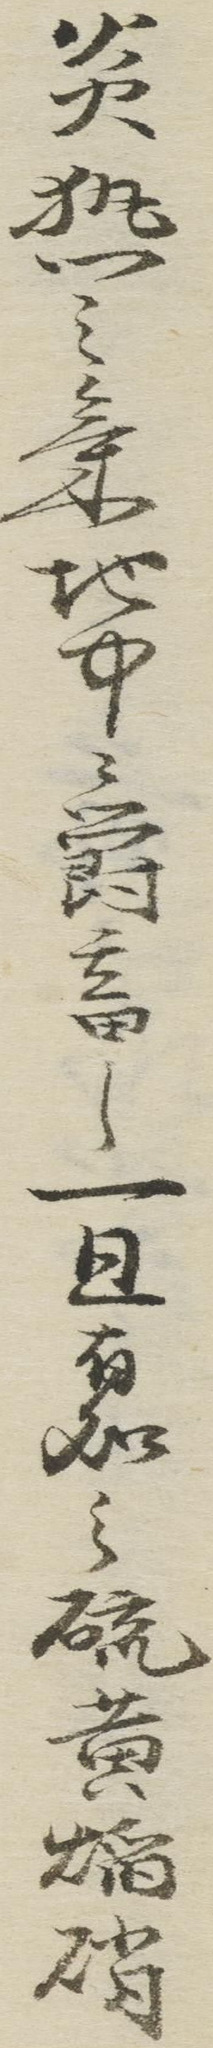炎熱の気地中ニ爵蓄し一旦有処之硫黄焔硝
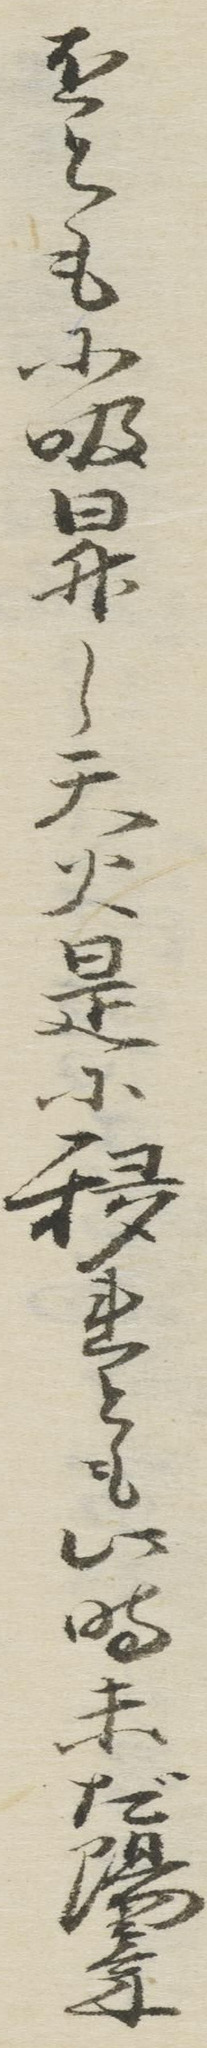をともに吸昇し天火是に移れとも此時未だ陽気
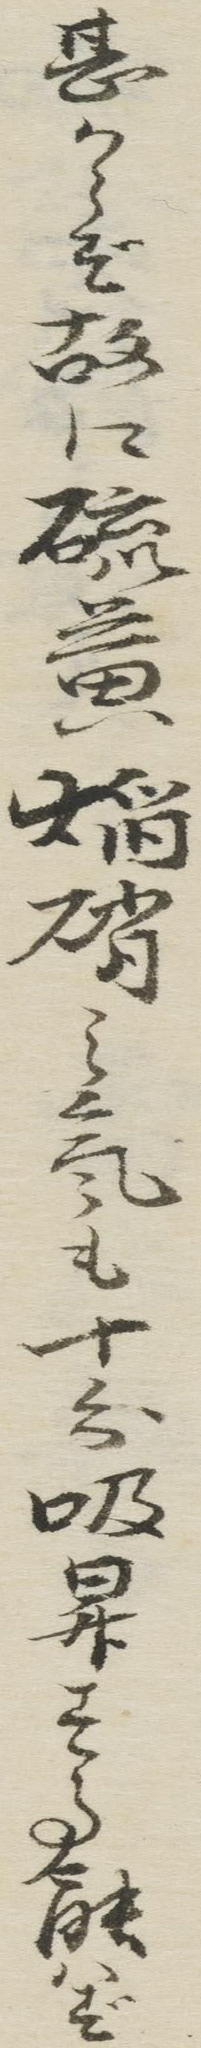甚からず故に硫黄焔硝之気も十分吸昇する能ハず
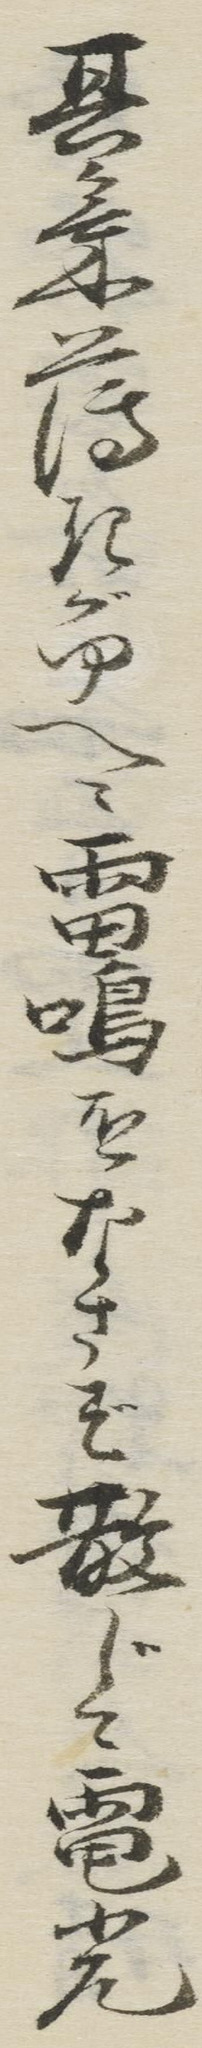其気薄きがゆへニ雷鳴をなさず散じて電光
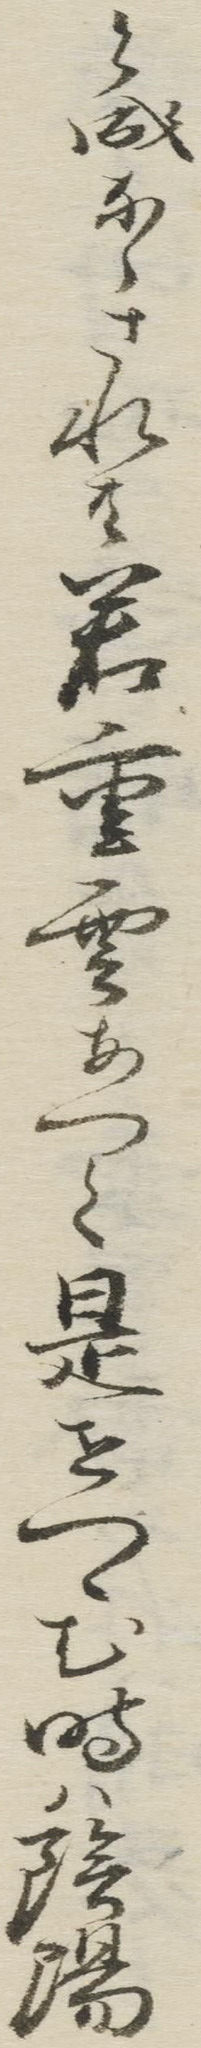と成なりされ共若重雲あつく是をつゝむ時ハ陰陽
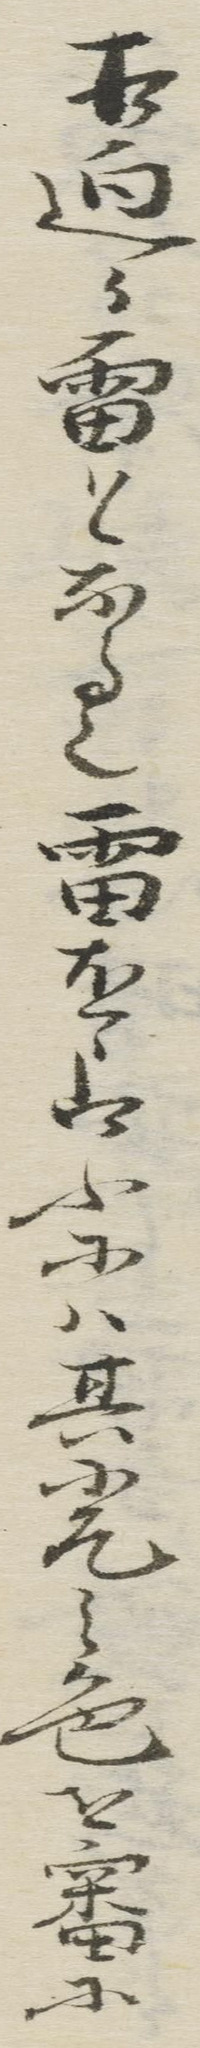相迫り雷となる也雷を占ふにハ其光之色を審に
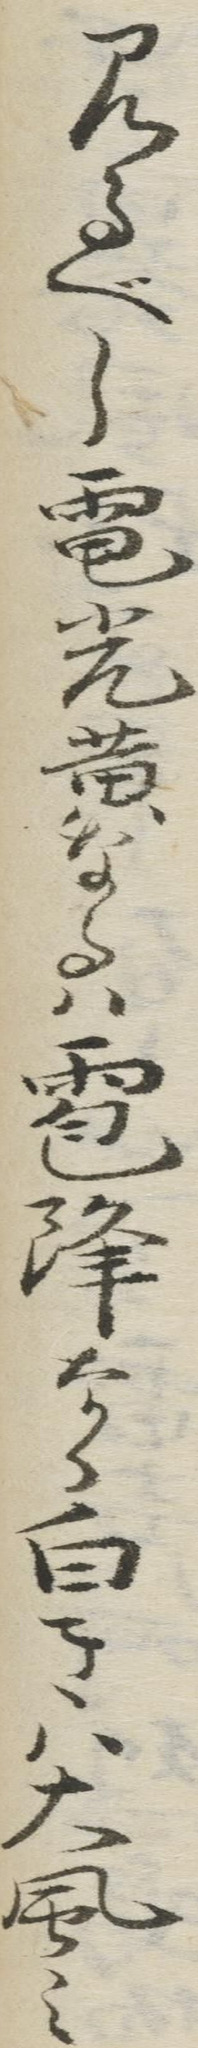見るべし電光黄なるハ雹降なり白きハ大風の
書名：諸国大地震大津波一代記
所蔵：東京大学地震研究所図書室 Earthquake Research Institute Library, The University of Tokyo, JAPAN
